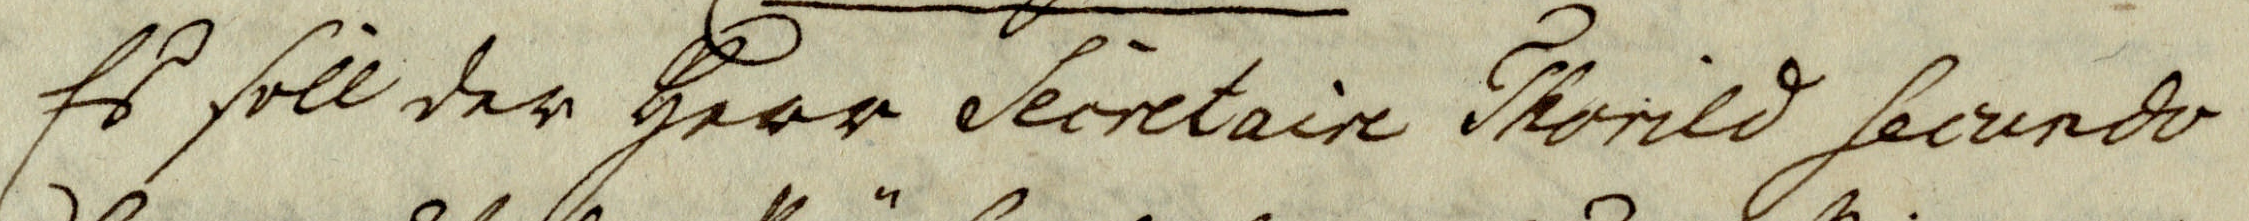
Es soll der Herr Secretaire Thorild secundo
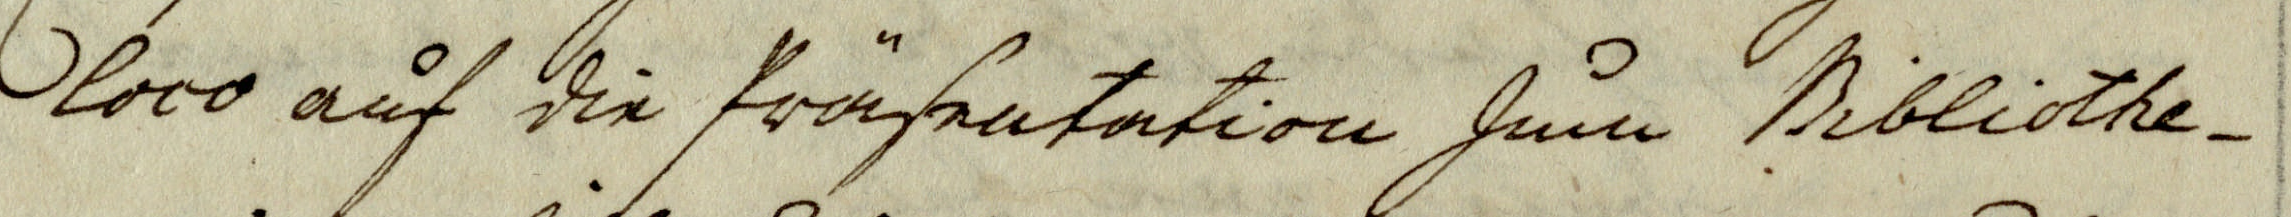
loco auf die Präsentation zum Bibliothe¬
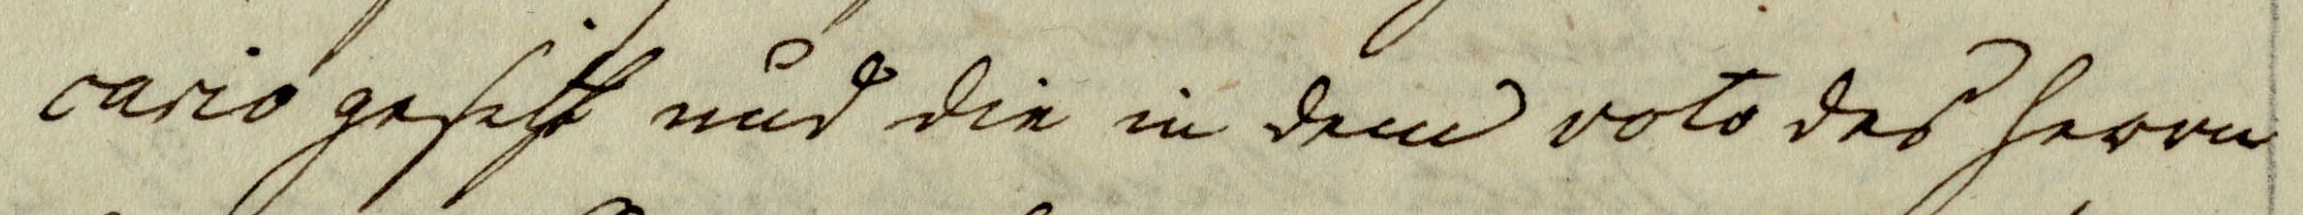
cario gesetzt und die in dem voto des Herrn
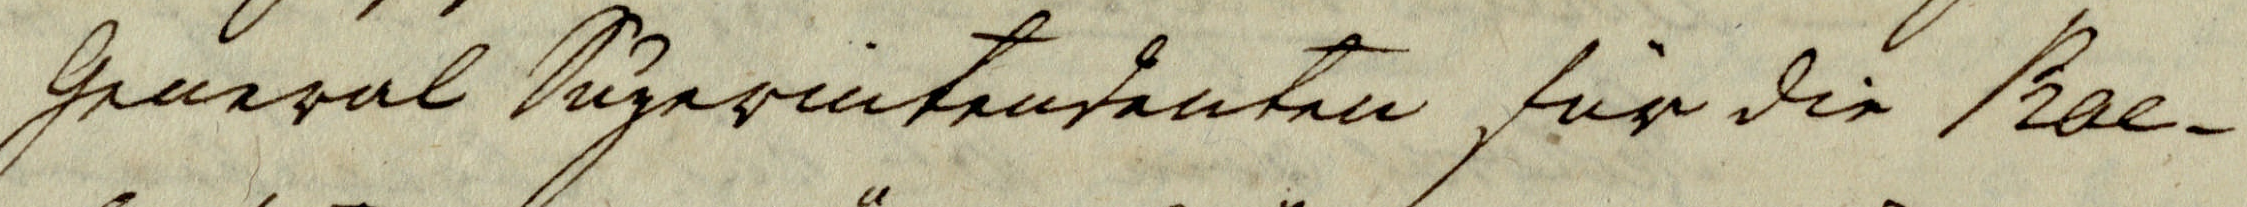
General Superintendenten für die Prae¬
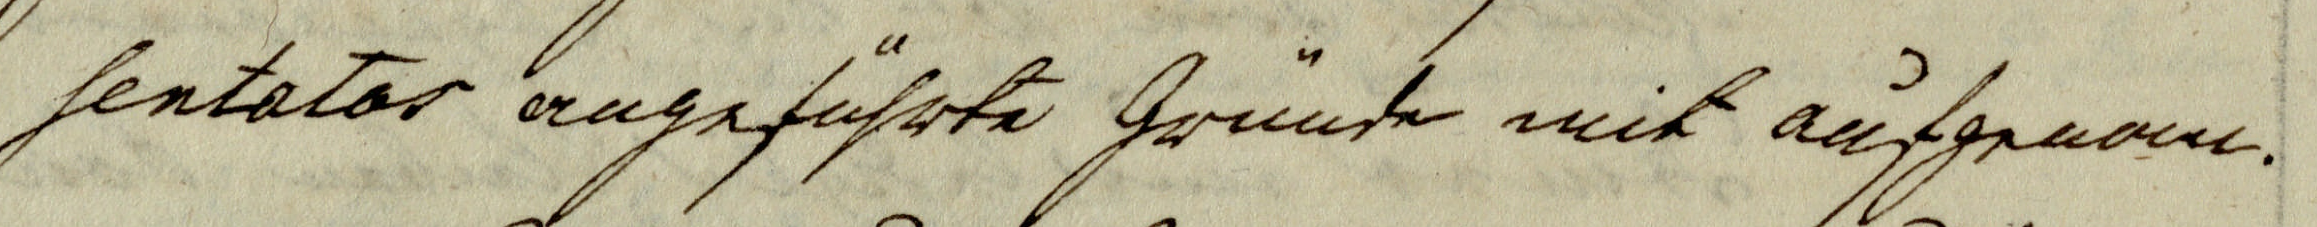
sentatos angeführte Gründe mit aufgenom¬
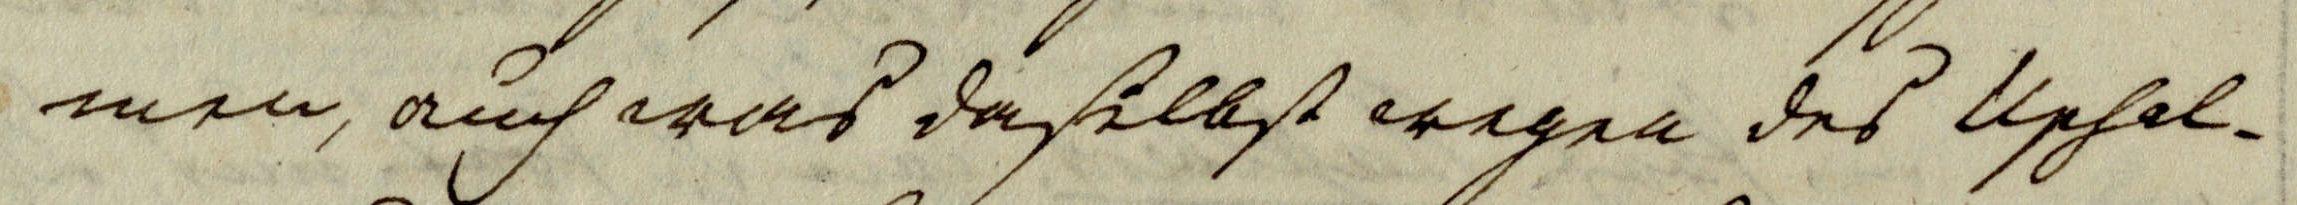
men, auch was daselbst wegen des Upsal¬
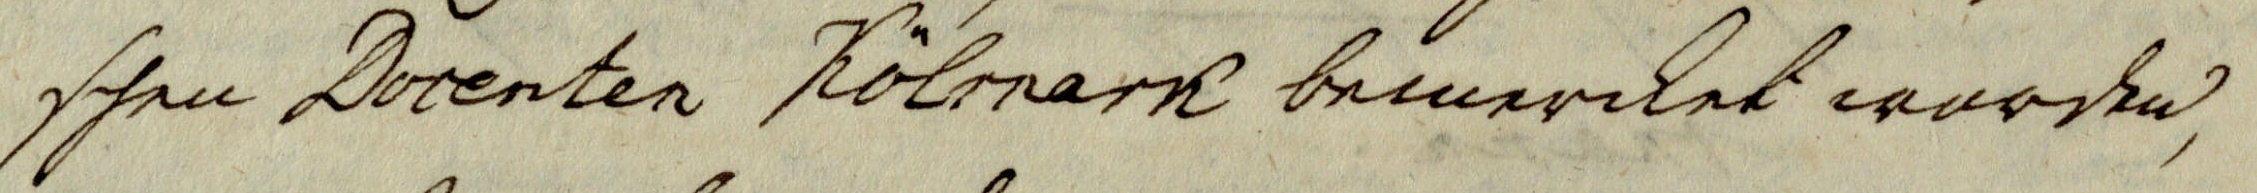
schen Docenten Kölmark bemercket worden,
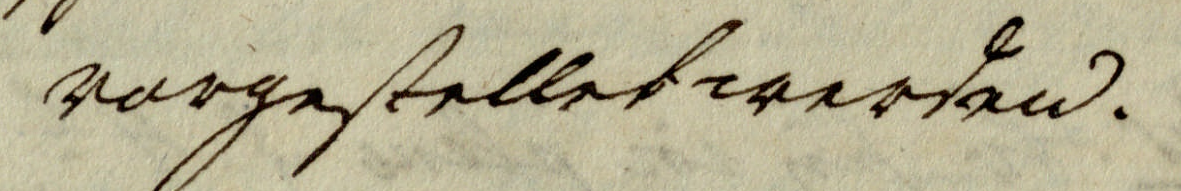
vorgestellet werden.
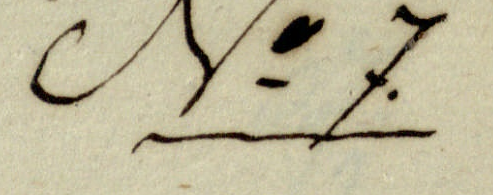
No 7.
